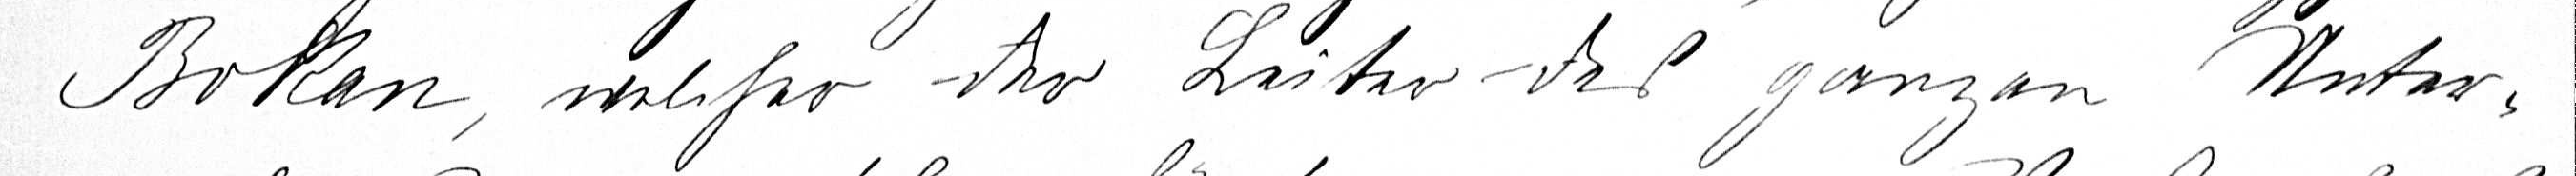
Bokan, welcher der Leiter des ganzen Unter¬
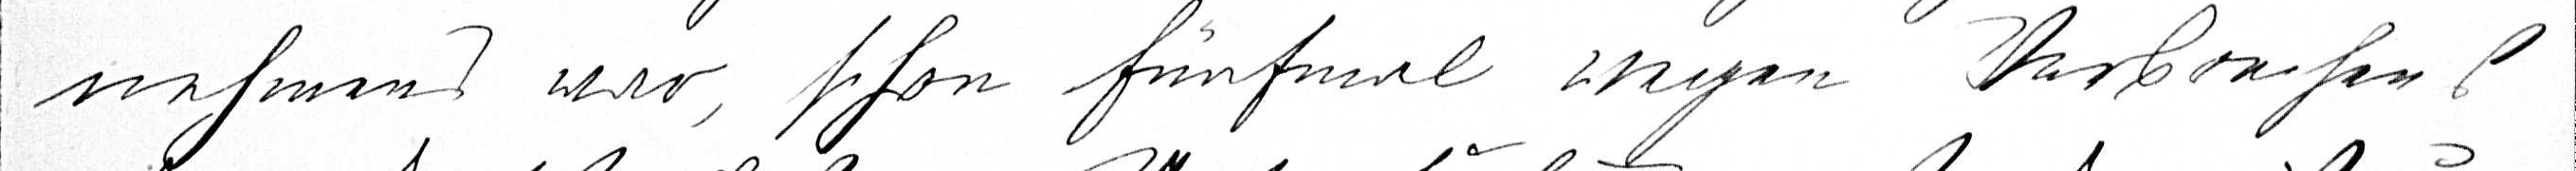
nehmens war, schon fünfmal wegen Verbrechens
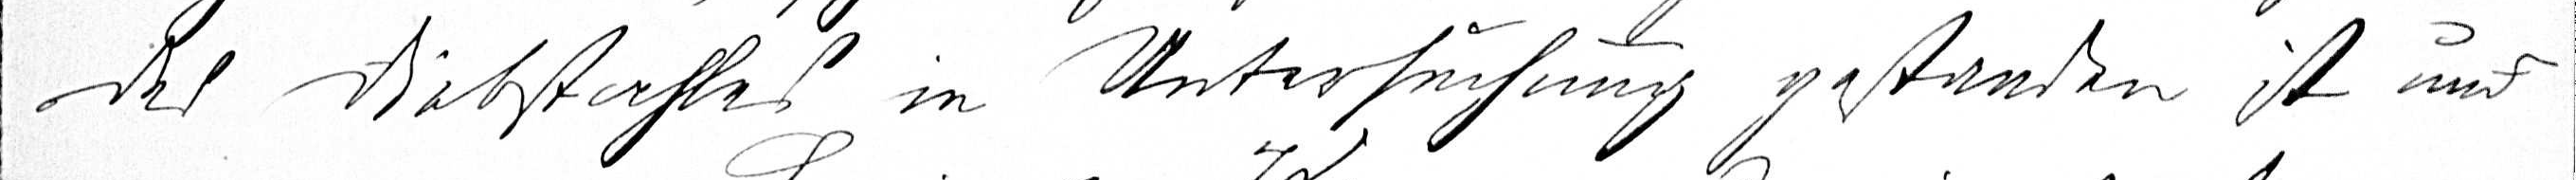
des Diebstahles in Untersuchung gestanden ist und
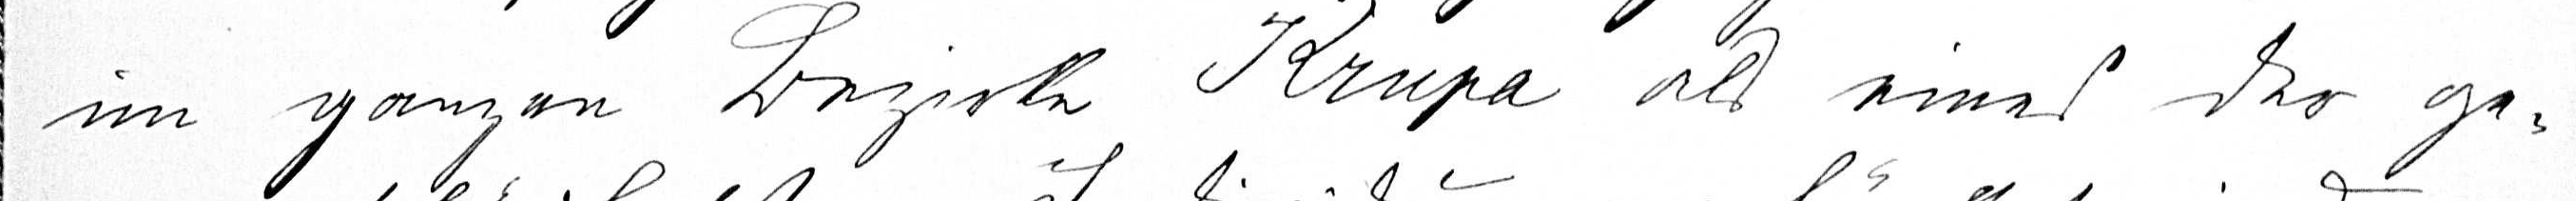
im ganzen Bezirke Krupa als eines der ge¬
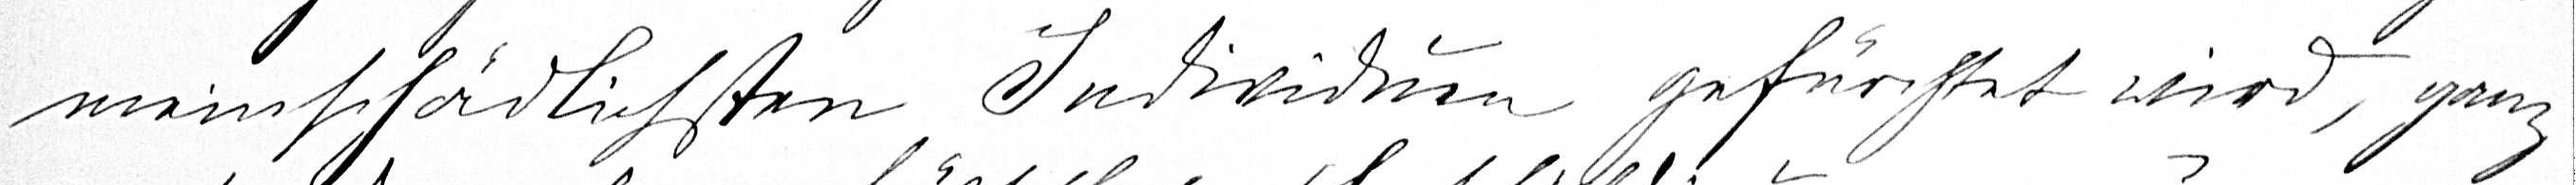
meinschädlichsten Individum gefürchtet wird, ganz
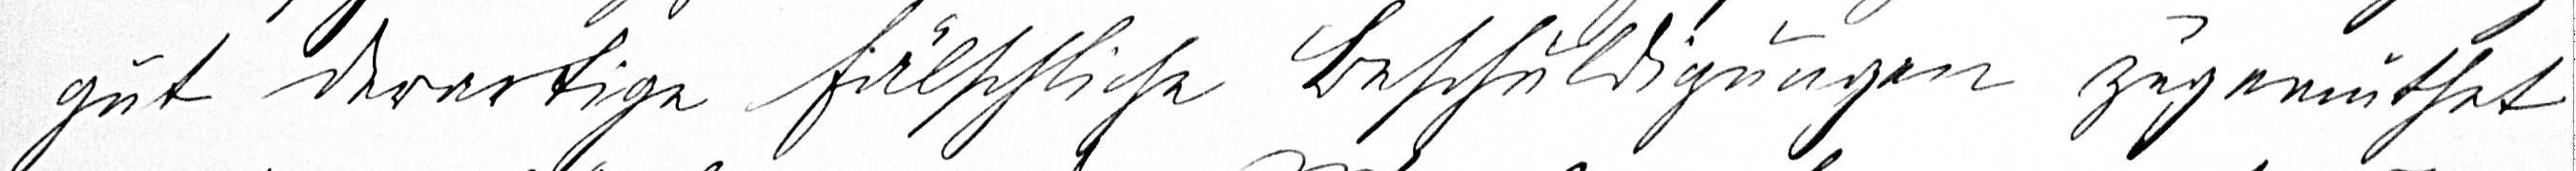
gut derartige fälschliche Beschuldigungen zugemuthet
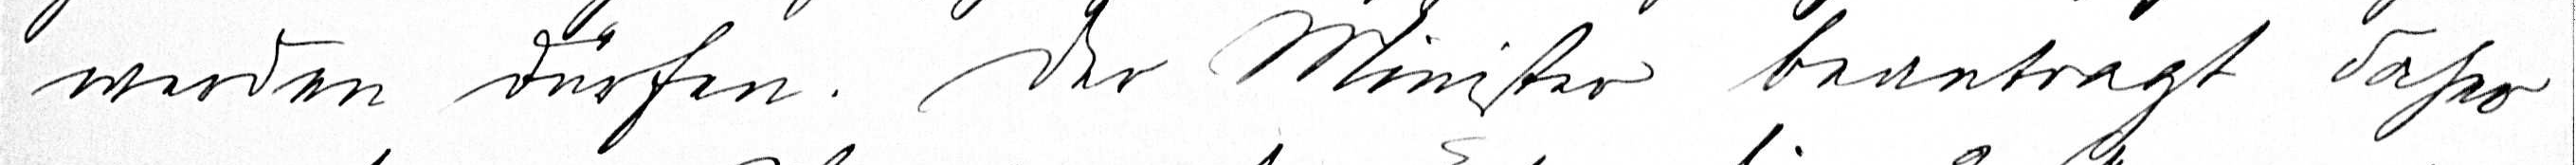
werden dürfen. Der Minister beantragt daher
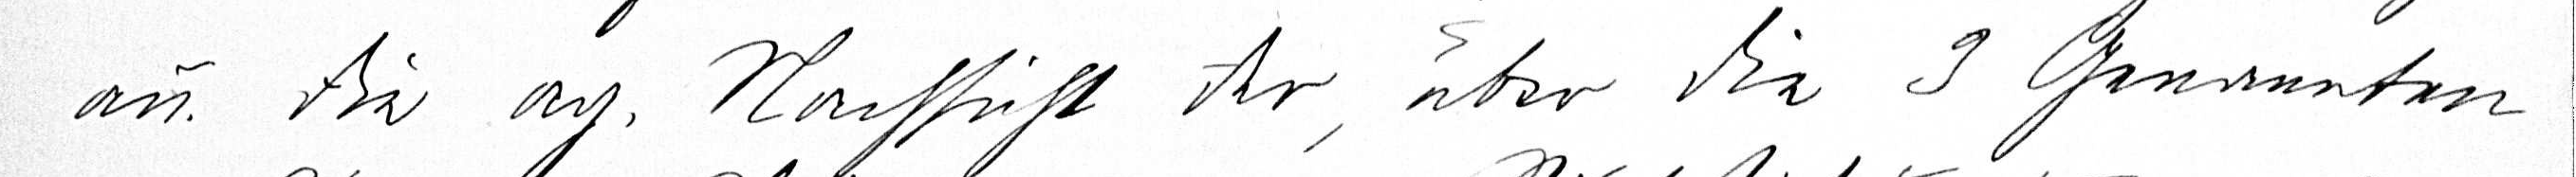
au. Die ag. Nachsicht der, über die 3 Genannten
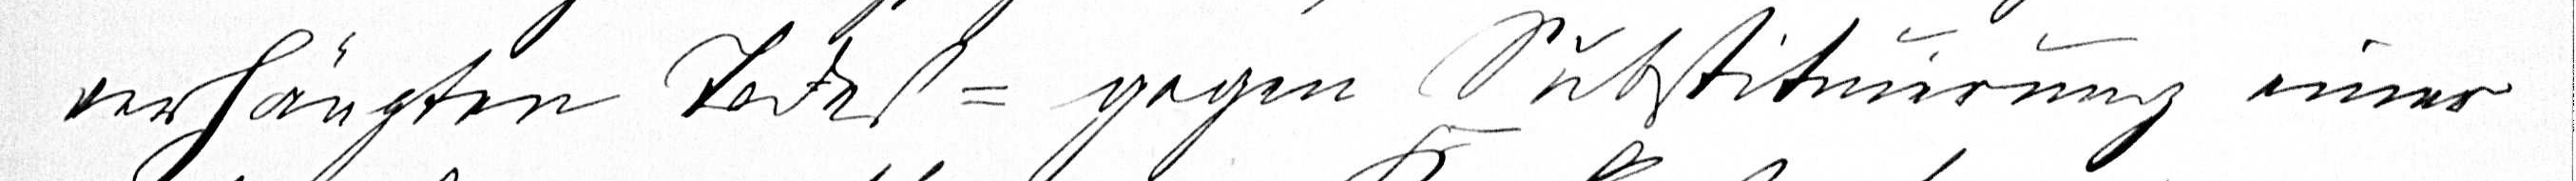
verhängten Todes= gegen Substituirung einer
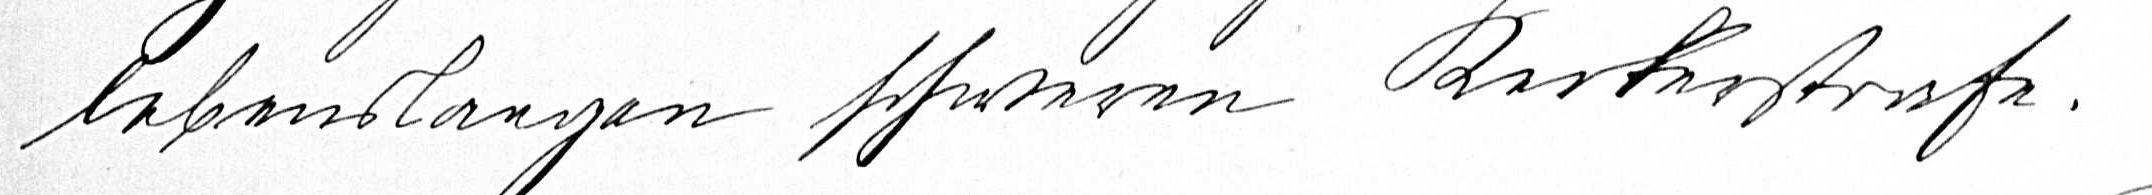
lebenslangen schweren Kerkerstrafe.
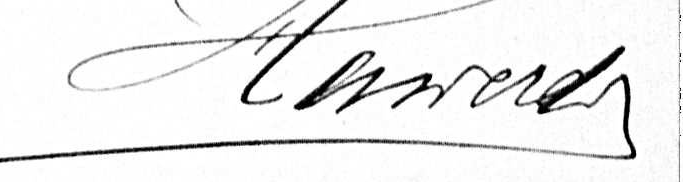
Hawerd
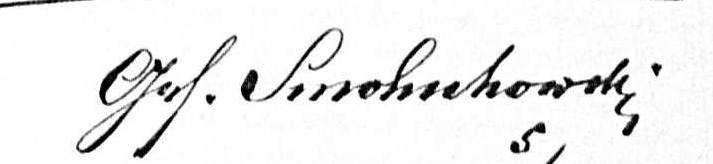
Ges. Smolnchowcki
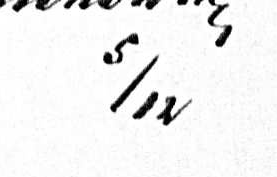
5/12
